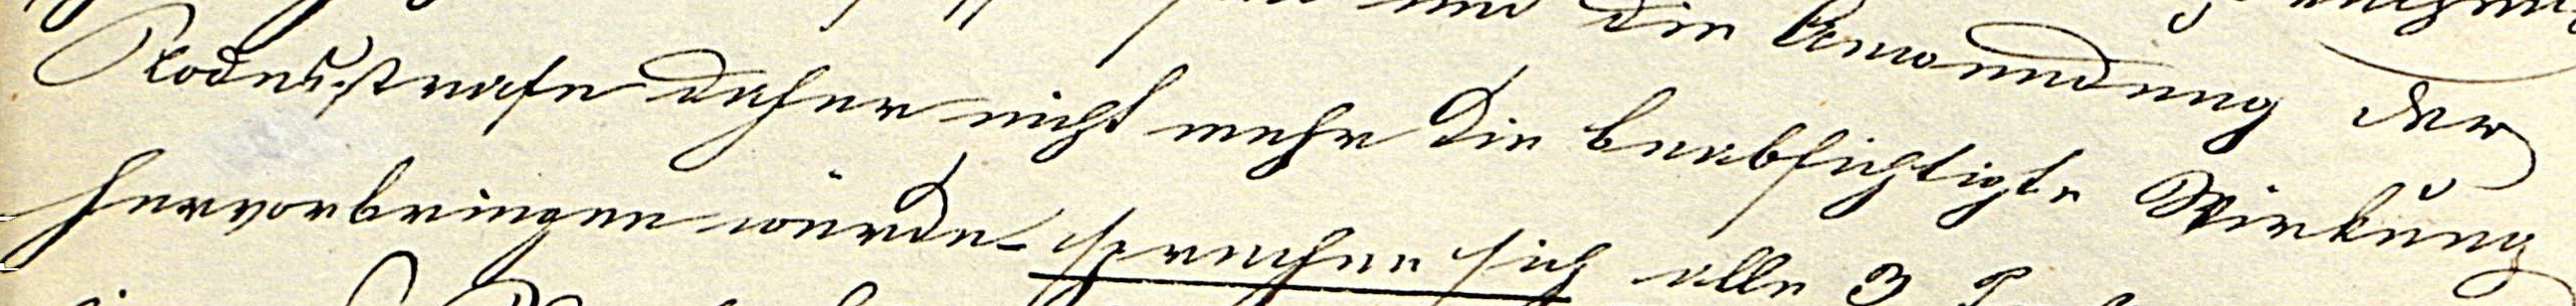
Todesstrafe daher nicht mehr die beabsichtigte Wirkung
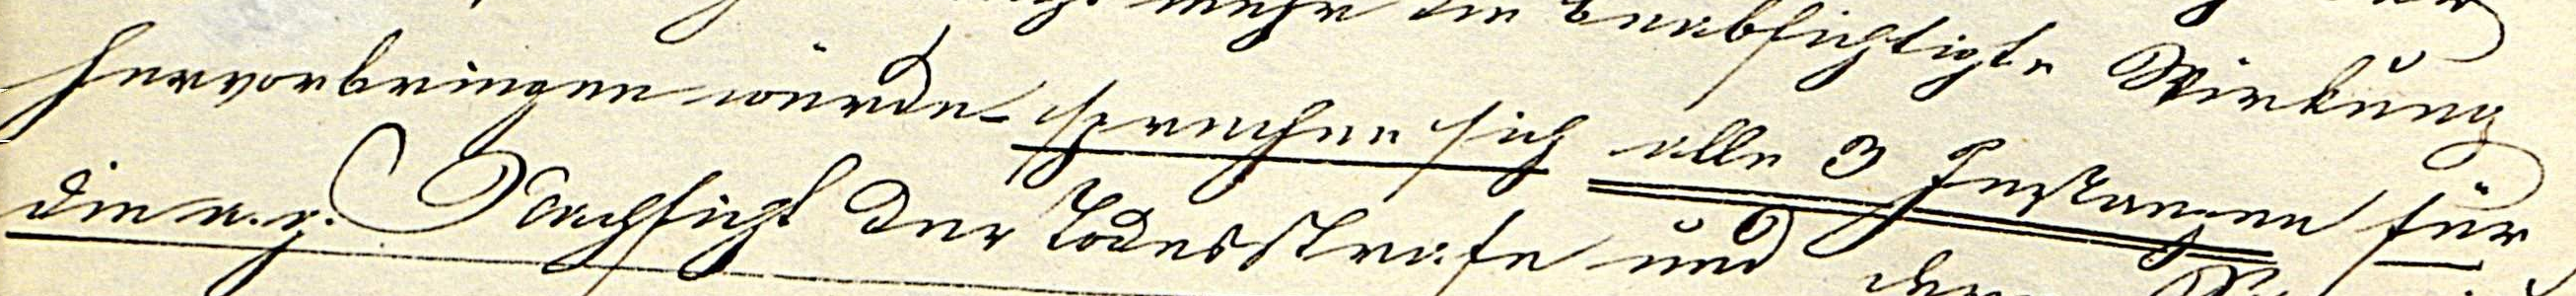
hervorbringen würde sprechen sich alle 3 Instanzen für
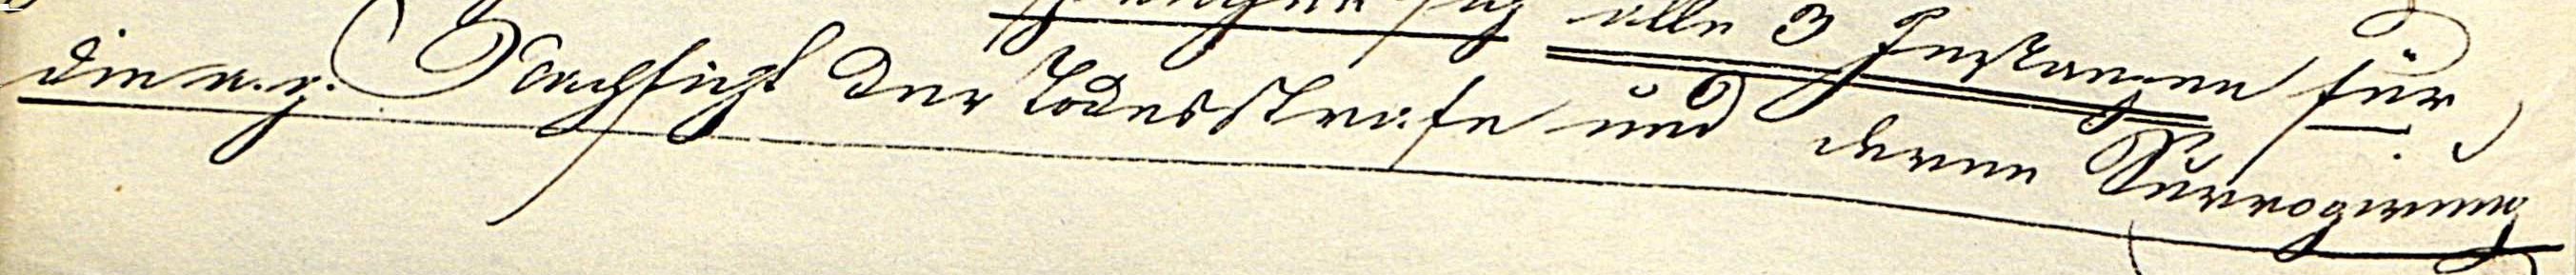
die a.g. Nachsicht der Todesstrafe und deren Surrogirung
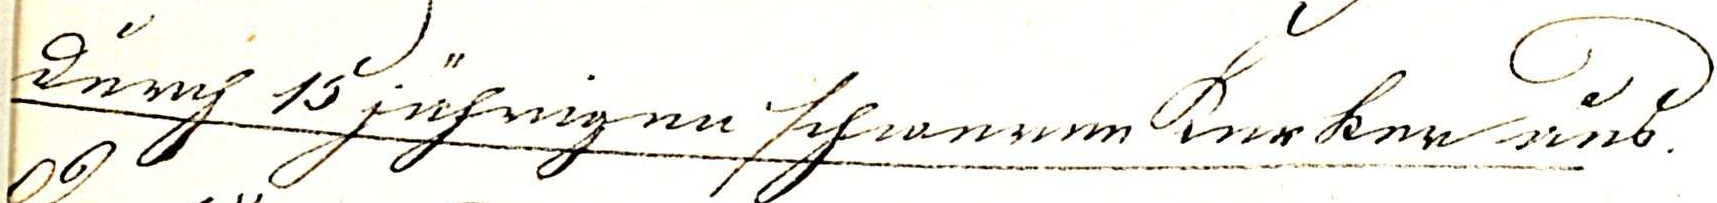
durch 15jährigen schwerem Kerker aus.
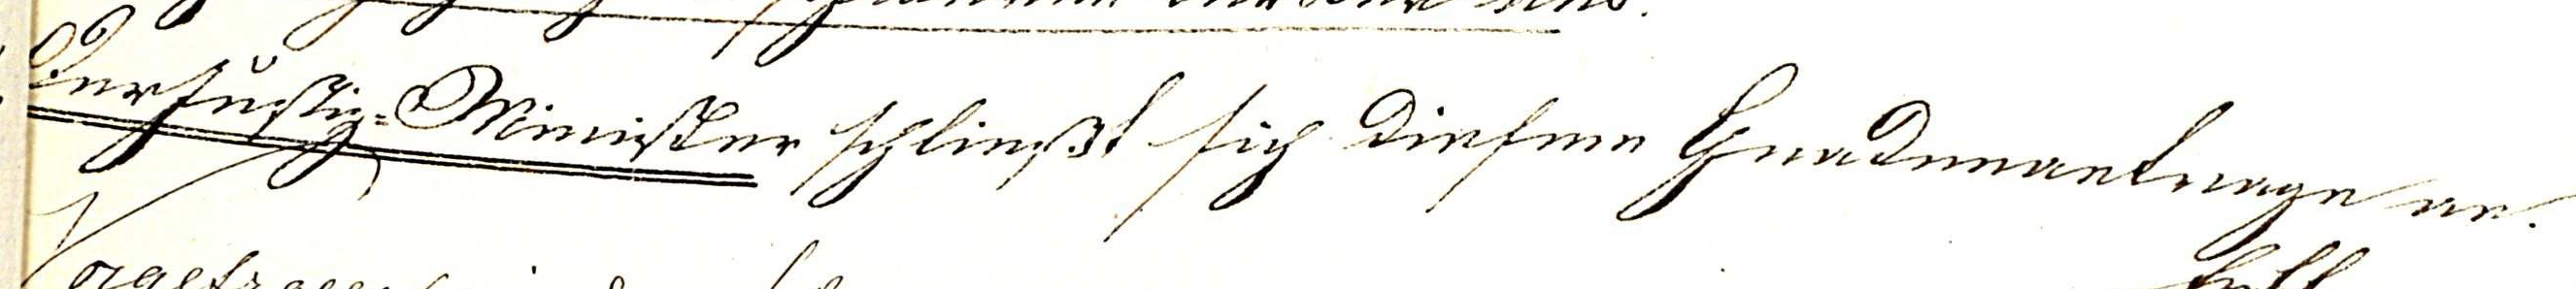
Der Justiz-Minister schließt sich diesem Gnadenantrage an.
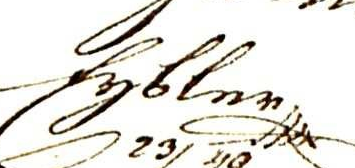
Eybler
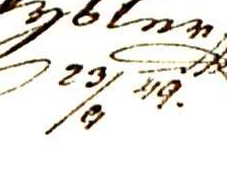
23/9 49
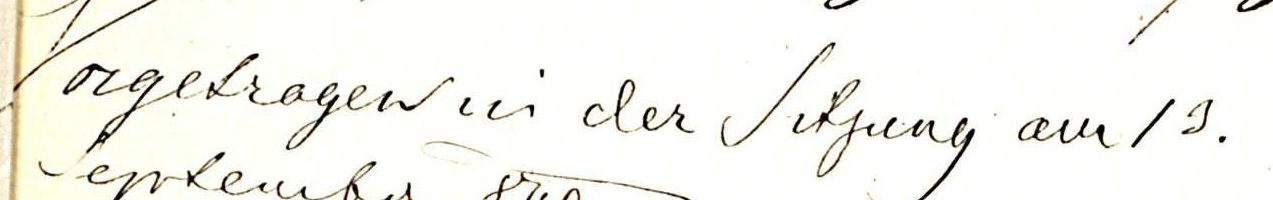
Vorgetragen in der Sitzung am 13.
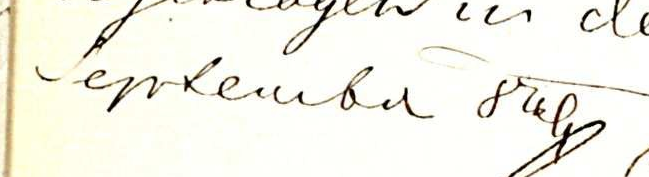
September 1849
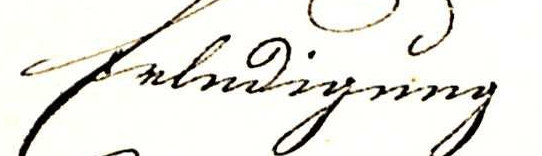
Erledigung
